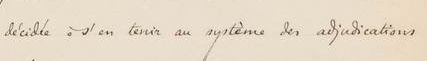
décidée à s'en tenir au système des adjudications
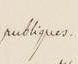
publiques.
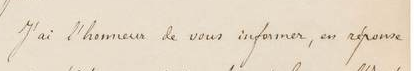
J'ai l'honneur de vous informer, en réponse
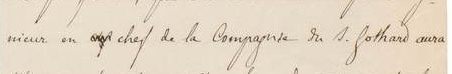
nieur en ... chef de la Compagnie du S. Gothard aura
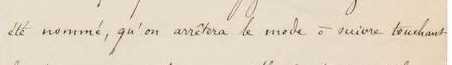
été nommé, qu'on arrêtera le mode à suivre touchant
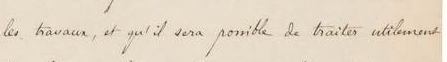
les travaux, et qu'il sera possible de traiter utilement
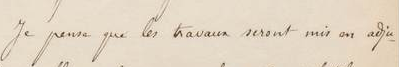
Je pense que les travaux seront mis en adju-
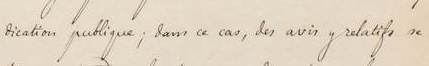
dication publique; dans ce cas, des avis y relatifs se
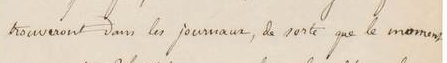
trouveront dans les journaux, de sorte que le moment
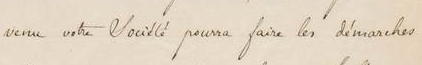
venu votre Société pourra faire les démarches
